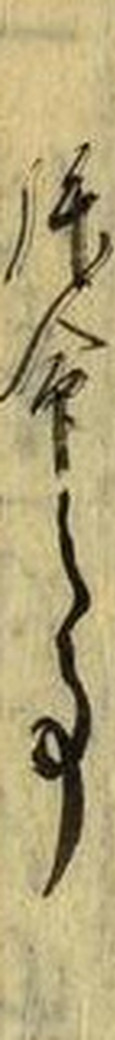拝命之事
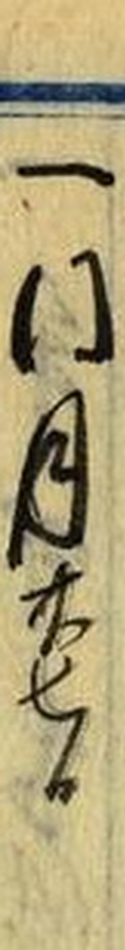一同月廿七日
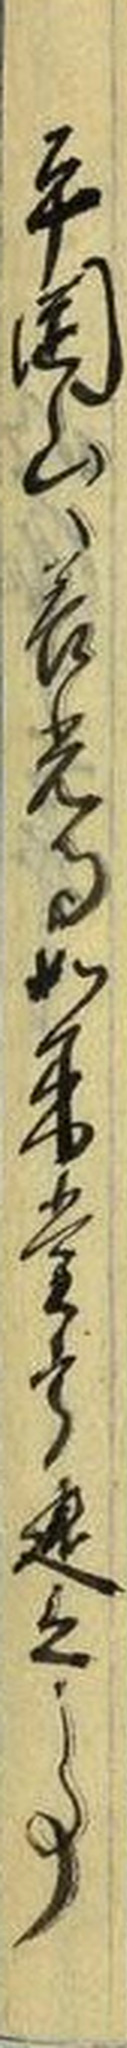平岡山へ善光寺如来堂宇建立之事
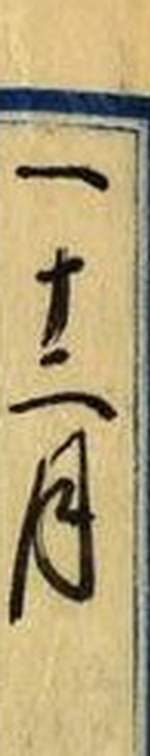一十二月
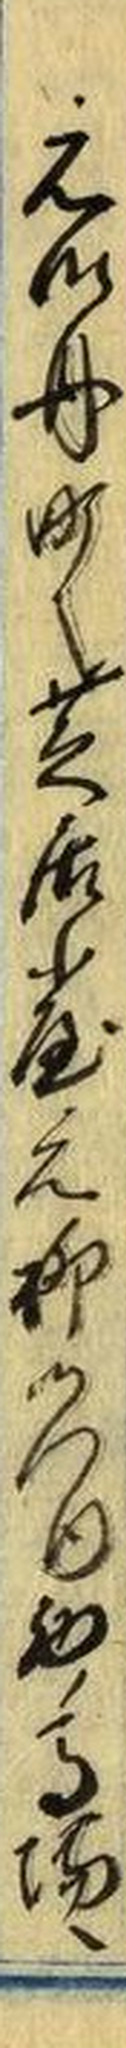元御舟町之芝居小屋元柳御門内西の馬場へ
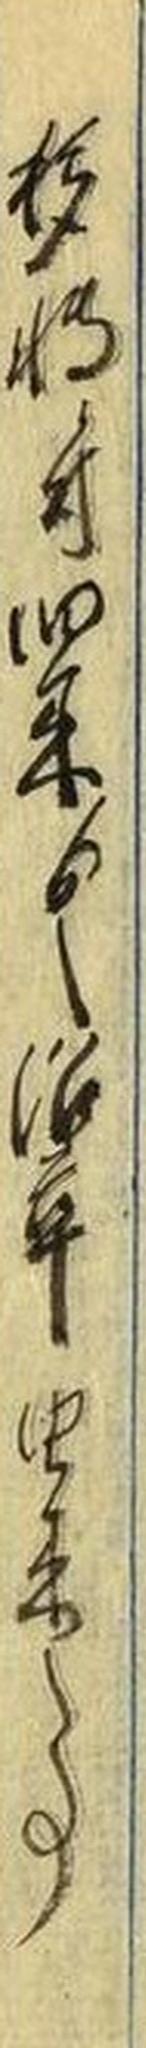移転に付旧来ゟ之沿革由来之事

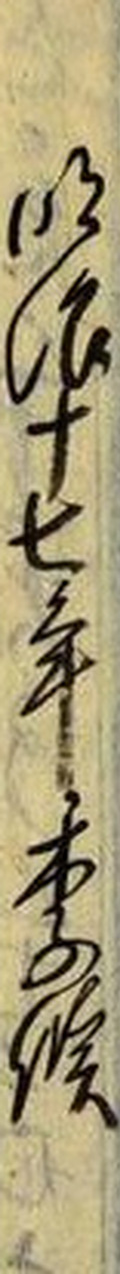明治十七年季候
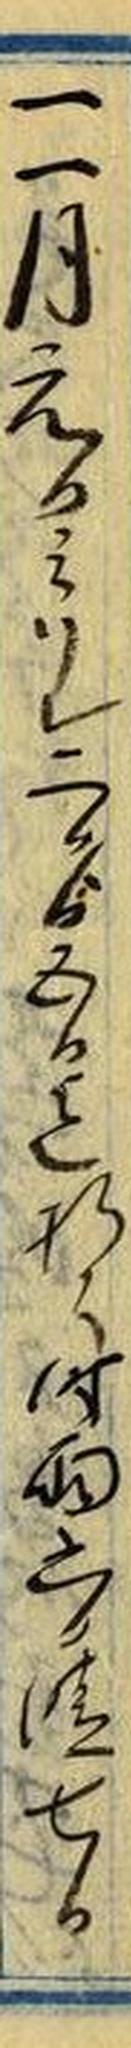一一月元日みそれ二日ゟ五日迄折々時雨六日晴七日
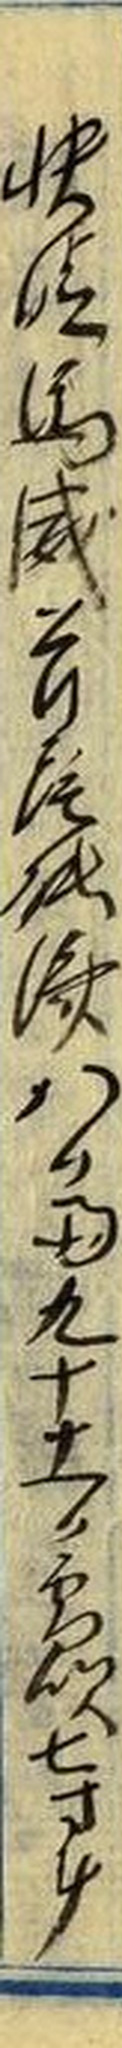快晴馬威首尾能済八日雨九十十一日雪吹七寸計
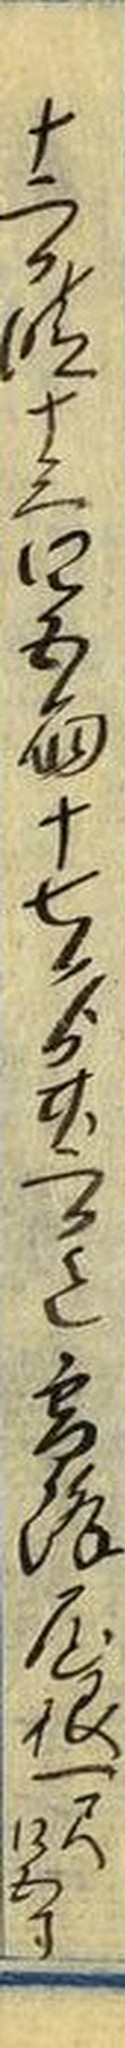十二日晴十三四五雨十七日ゟ廿二日雪降屋根一尺四五寸
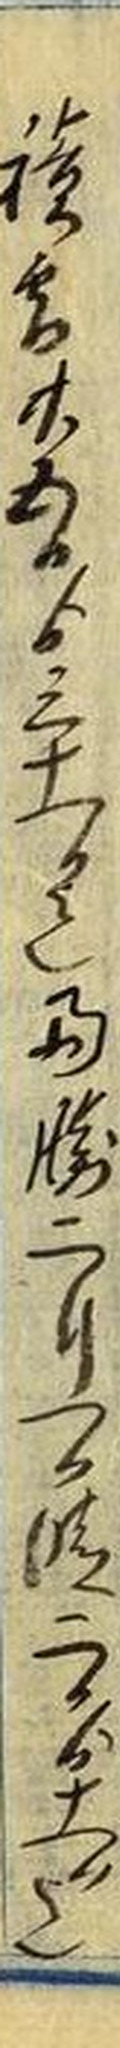積雪廿五日ゟ三十一日迄雨勝二月一日晴二日ゟ十一日迄
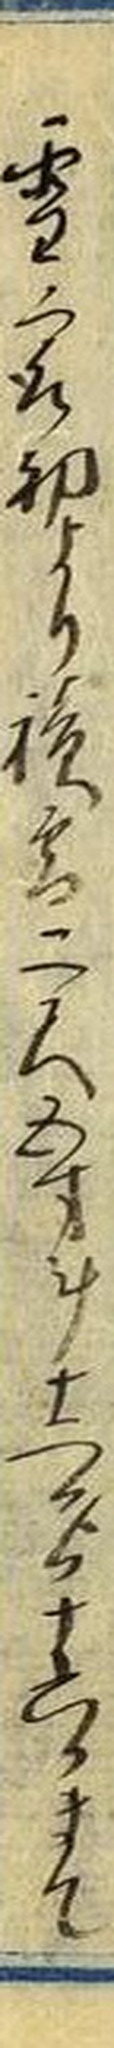雪最初より積雪二尺五寸計十二日ゟ十六日まて
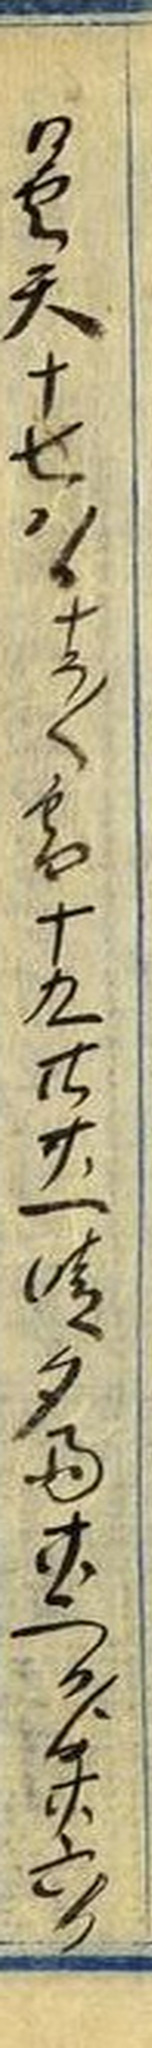曇天十七八日チラ〳〵雪十九廿廿一晴夕雨廿二日ゟ廿六日
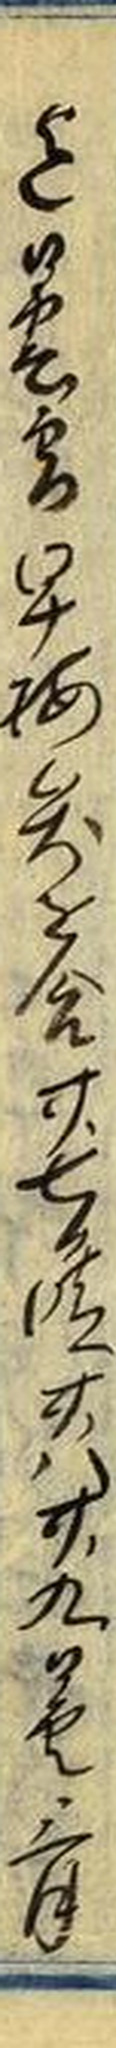迄曇雪早梅笑を含廿七日晴廿八廿九曇三月
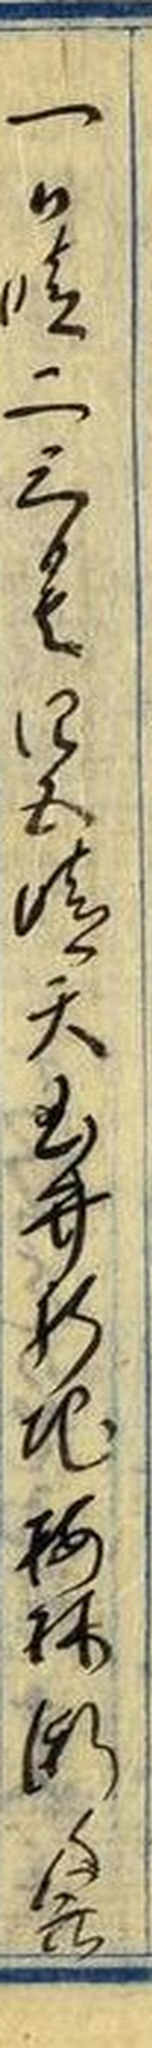一日晴二三曇四五晴天玉井新地梅林漸く開
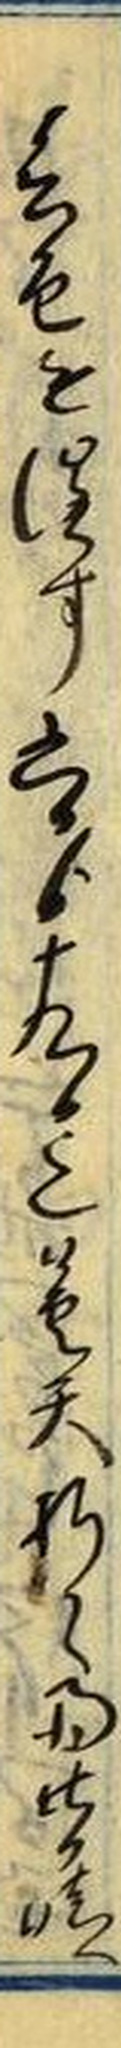春色を潤す六日ゟ十九日迄曇天折々雨廿日晴
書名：温古集 五巻
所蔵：福井県文書館 Fukui Prefectural Archives
